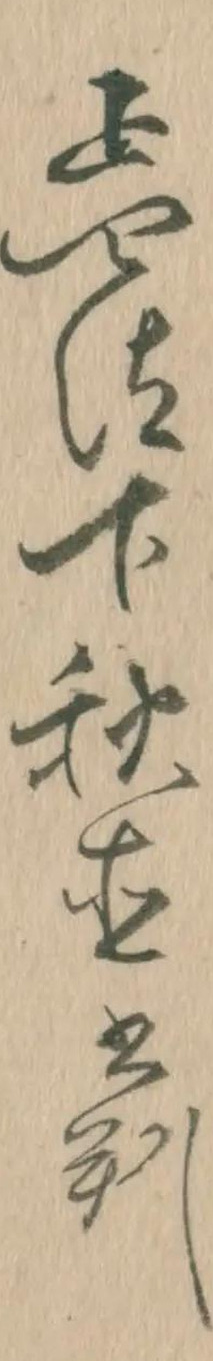正四位下秋直書判

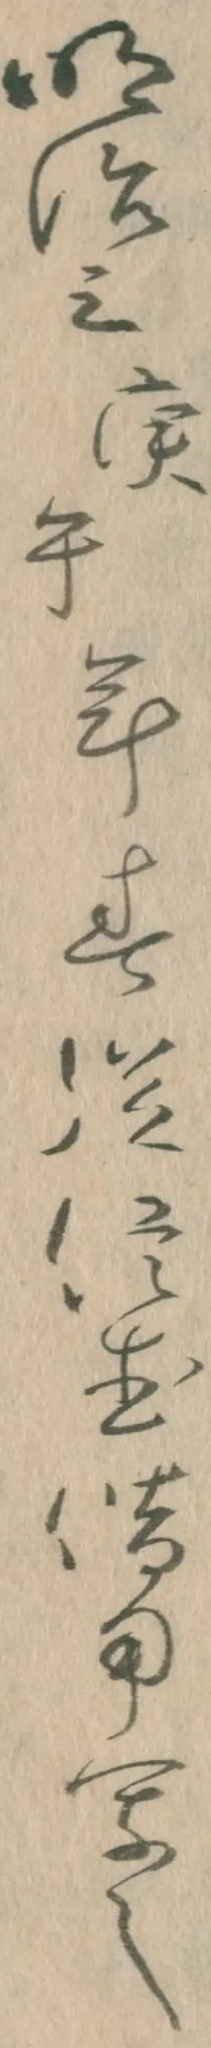明治三庚午年春従願置借用写之
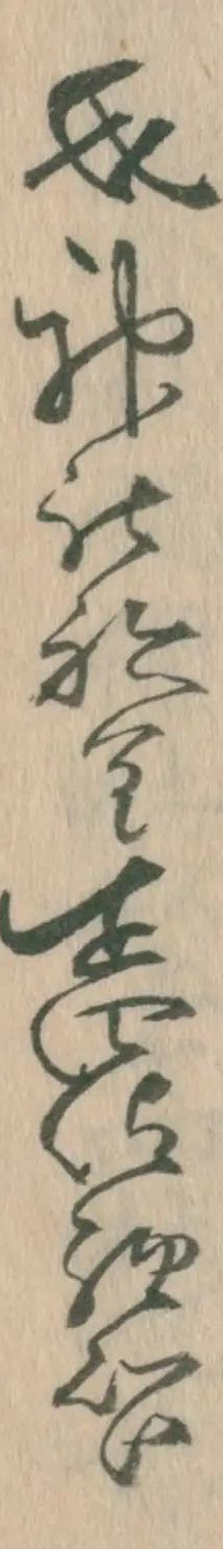氏神社祢宜正四位経智

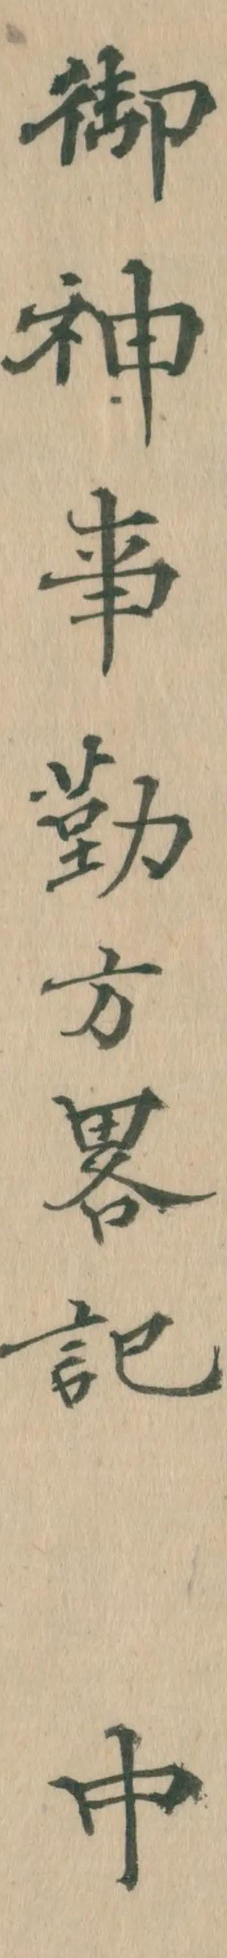御神事勤方略記中

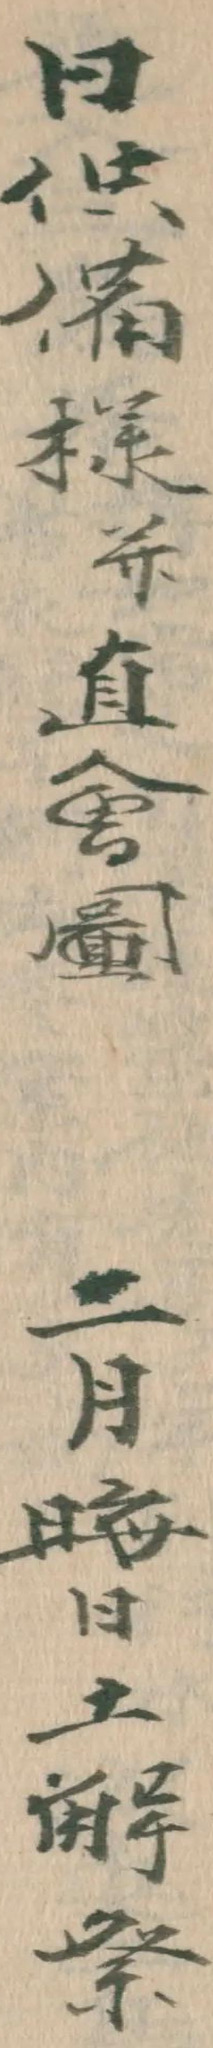日供備様并直会図二月晦日土解祭
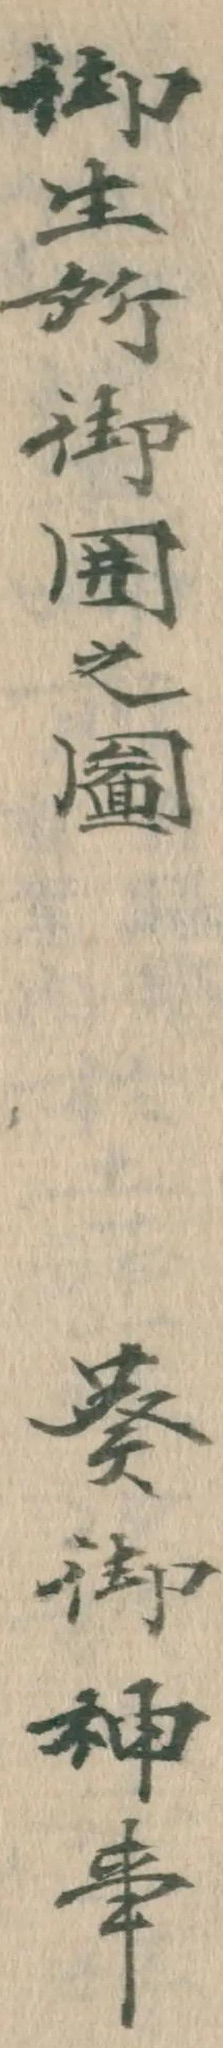御生所御囲之図葵御神事
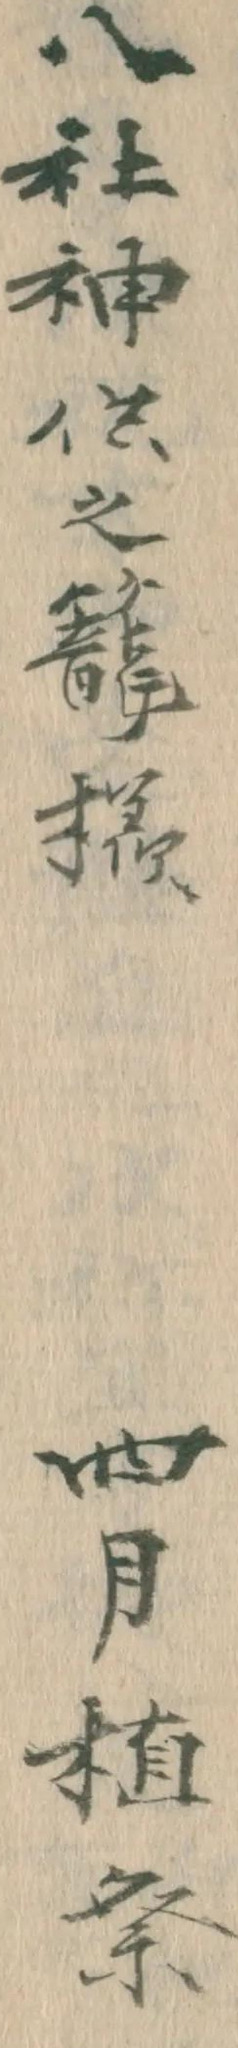八社神供之籠様四月植祭

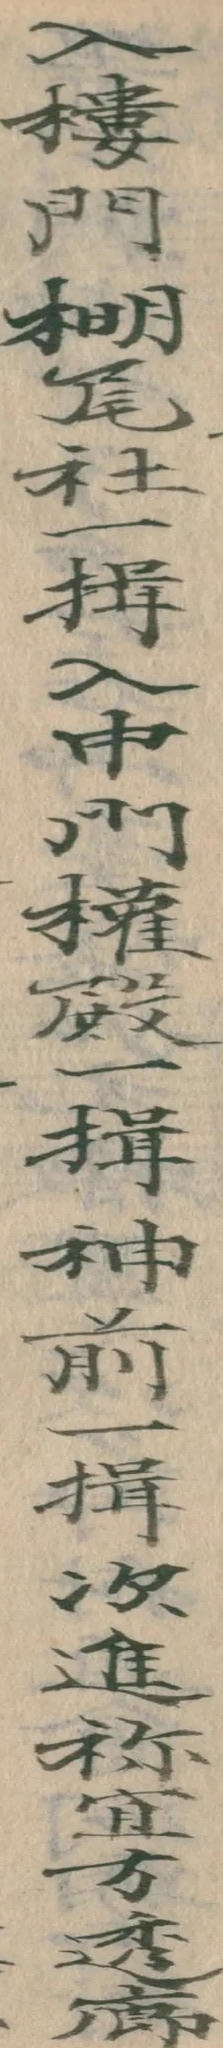入楼門棚尾社一揖入中門権殿一揖神前一揖次進祢宜方透廊

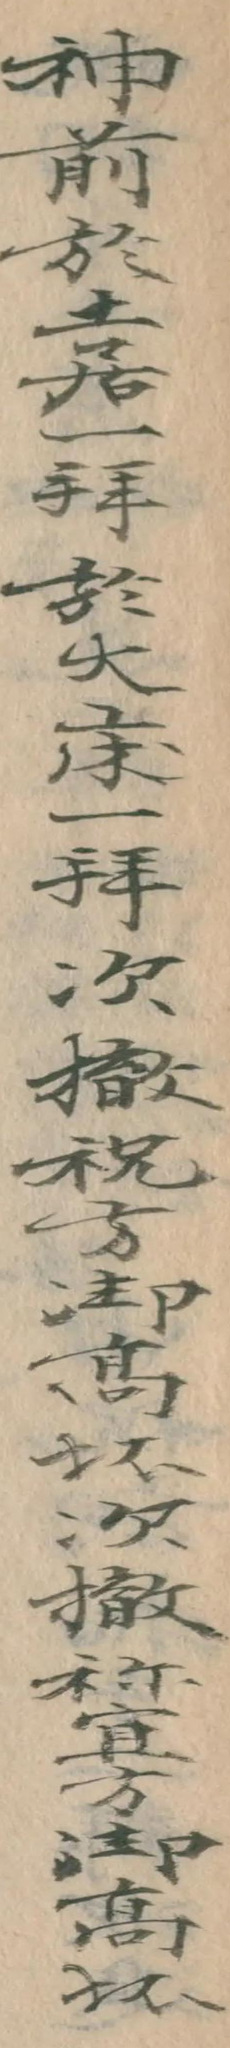神前於土居一拝於大床一拝次撤祝方御高坏次撤祢宜方御高坏
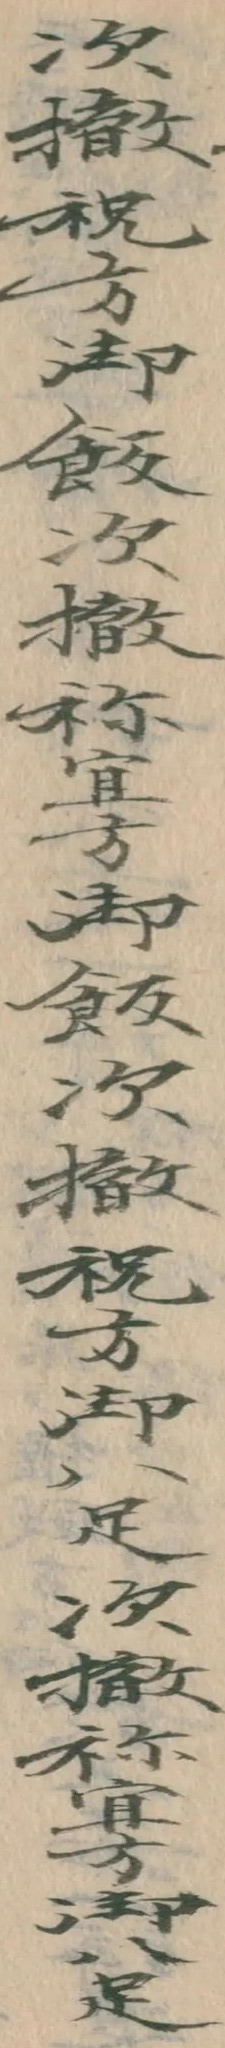次撤祝方御飯次撤祢宜方御飯次撤祝方御八足次撤祢宜方御八足
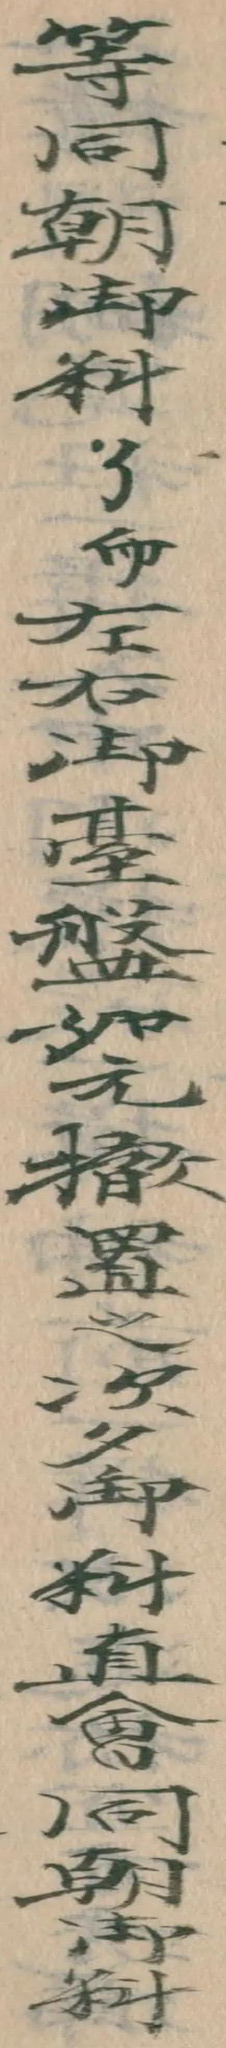等同朝御料了而左右御台盤如元撤置之次夕御料直会同朝御料
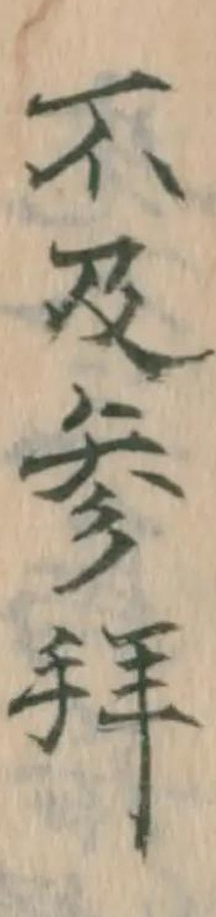不及参拝
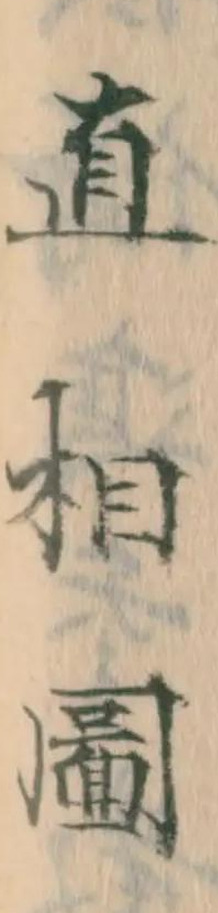直相図
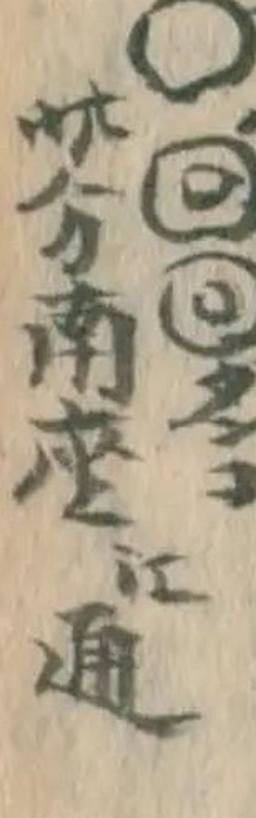此分南座江通

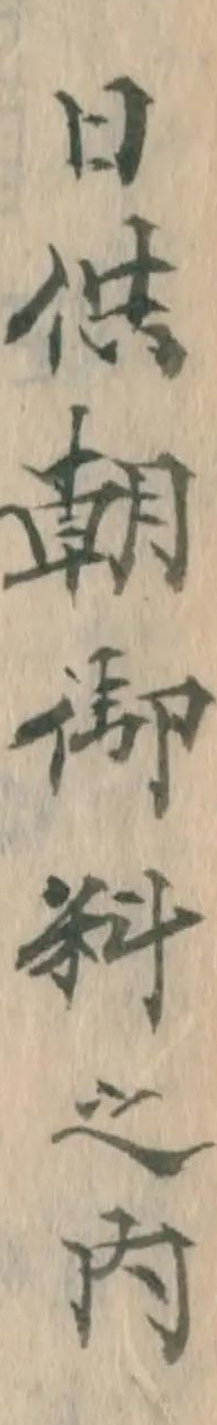日供朝御料之内
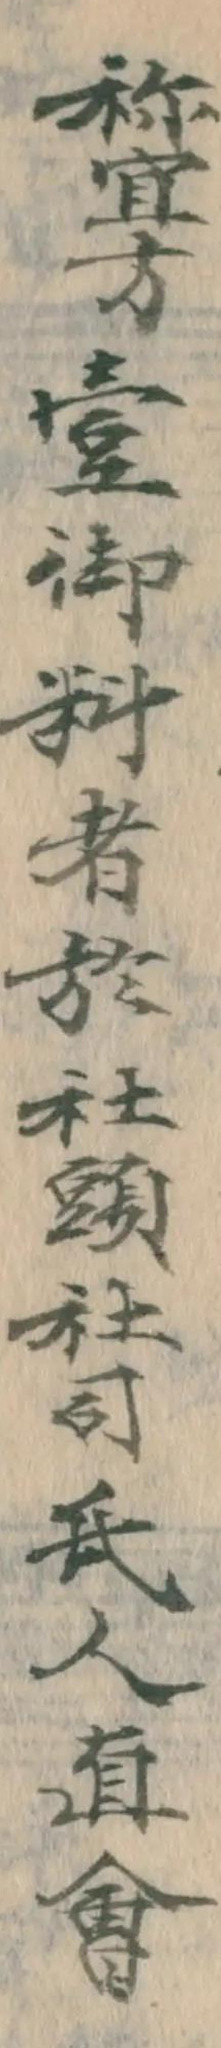祢宜方壱御料者於社頭社司氏人直会
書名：賀茂社記録. 第9冊
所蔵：国立国会図書館 National Diet Library, JAPAN
